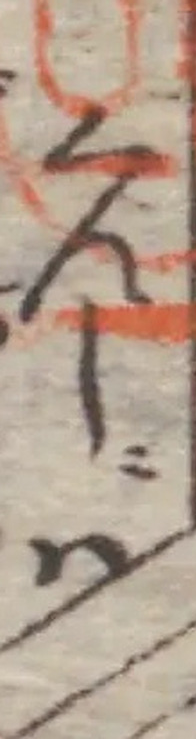くんしには
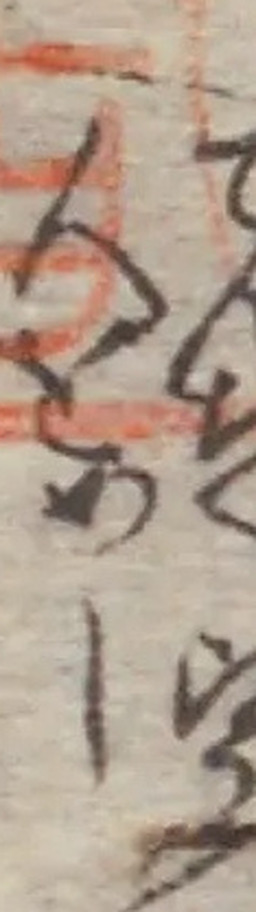人をめし
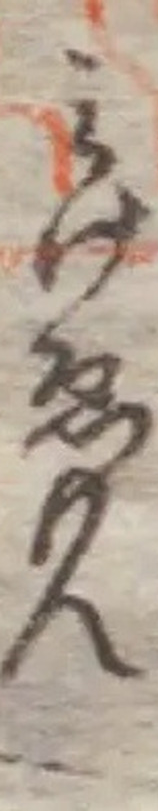みけゑもん
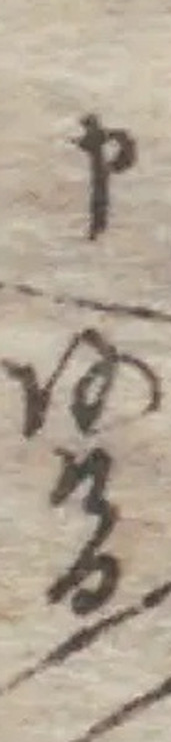申あける

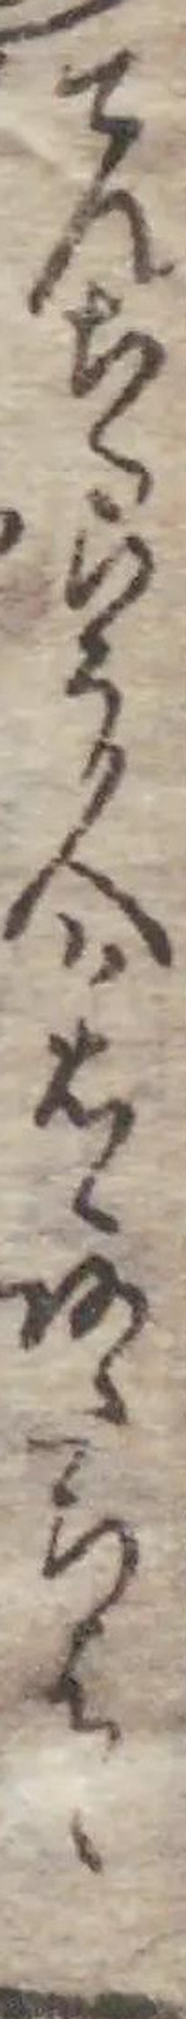てんちくらう人かはゝあたちはゝ
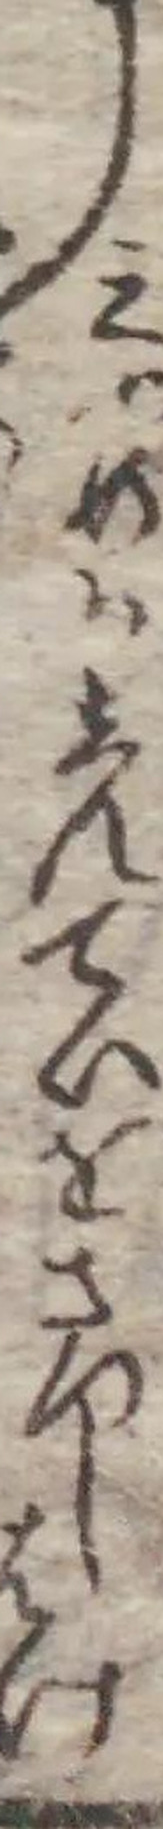三つめかしんていをさつしはけ
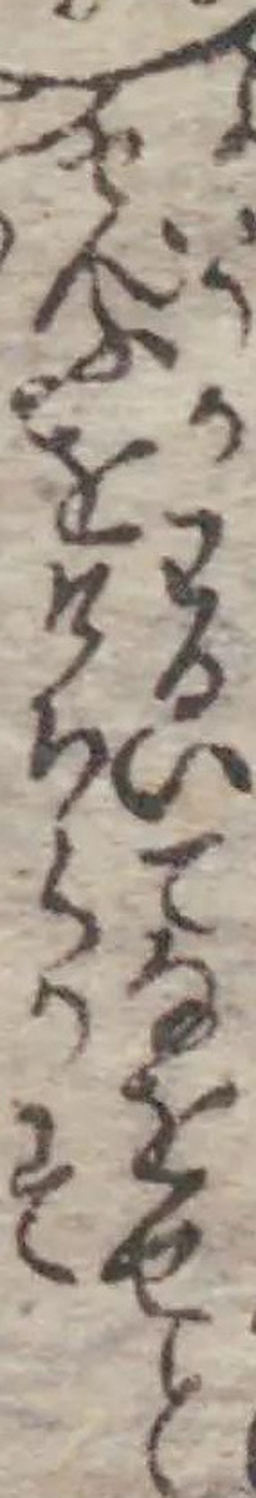せんふをけちらかす
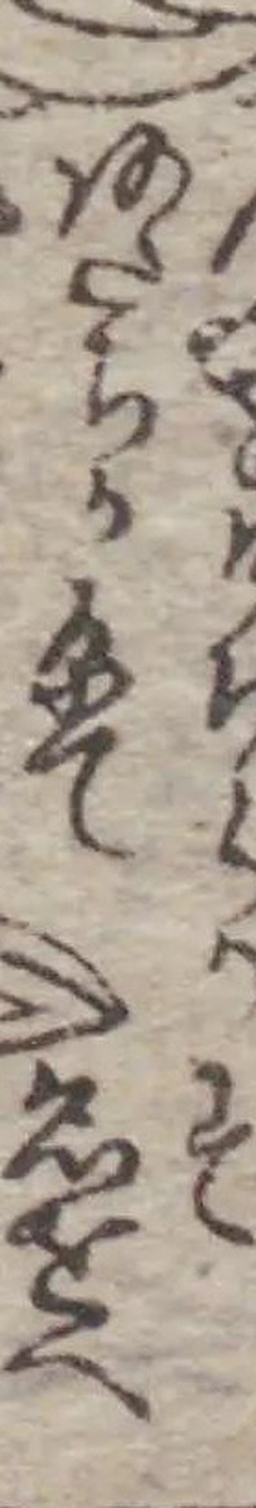あたちか原て名をへ
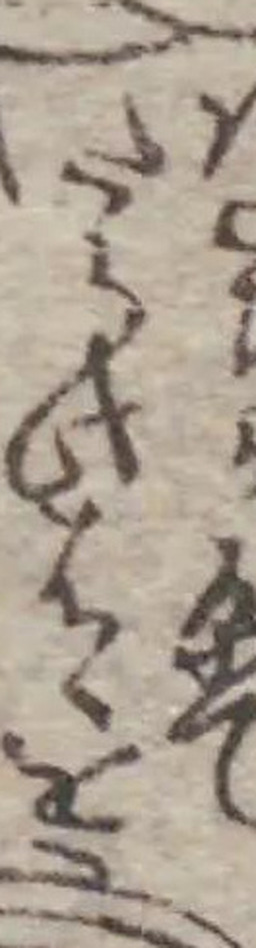たる此はゝを
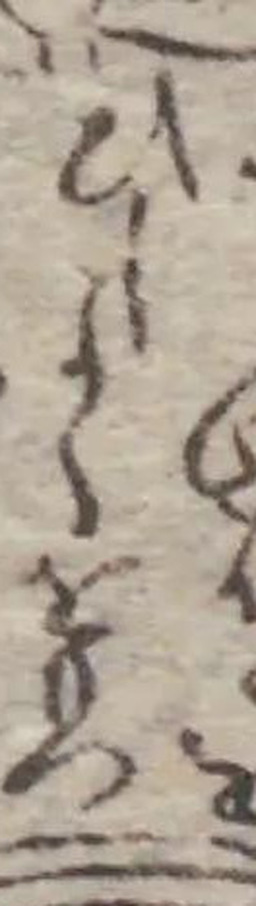ひしよくをもつ
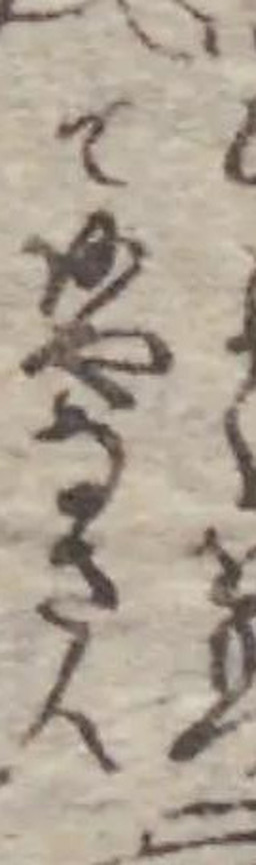てあやなさん
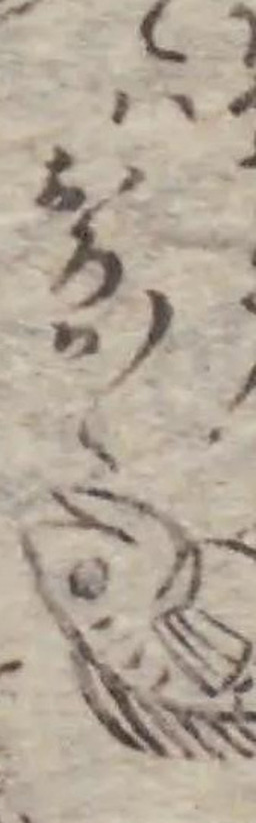おろか〳〵
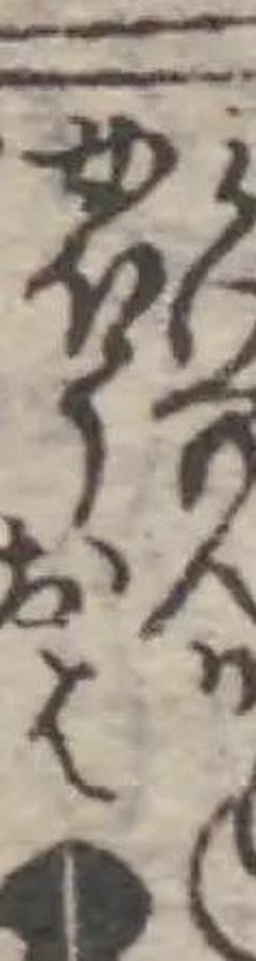女ほうおは
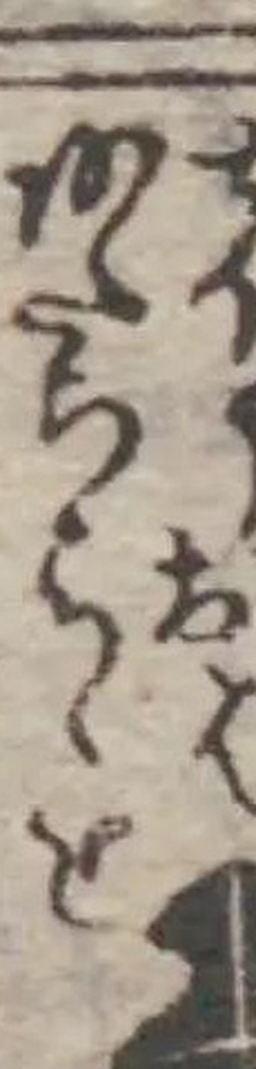あたちはゝを
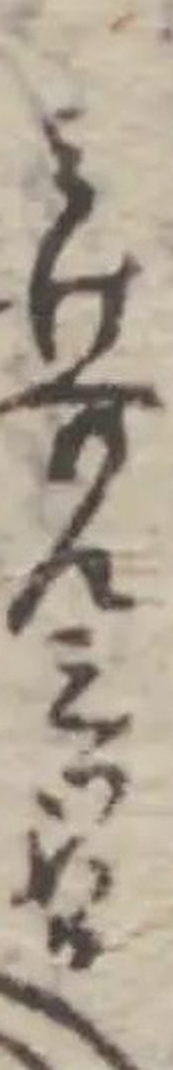みけへもん三つめか
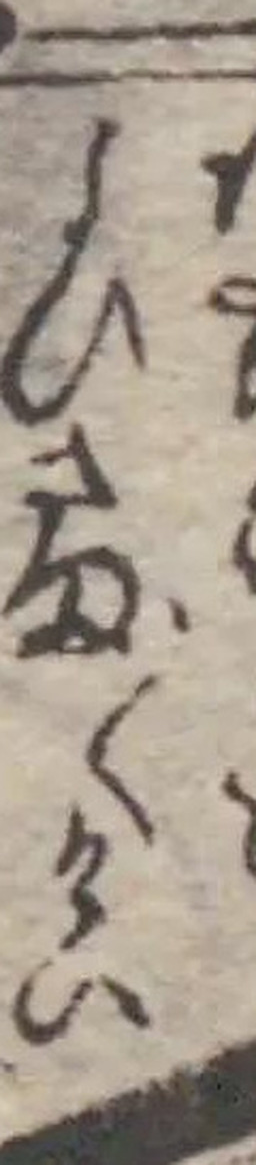よひさま〳〵かゝい
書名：化物三ツ目大ほうい 2巻
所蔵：国立国会図書館 National Diet Library, JAPAN
